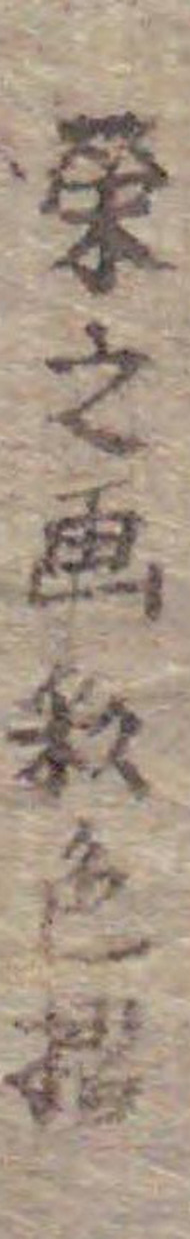栄之画彩色摺
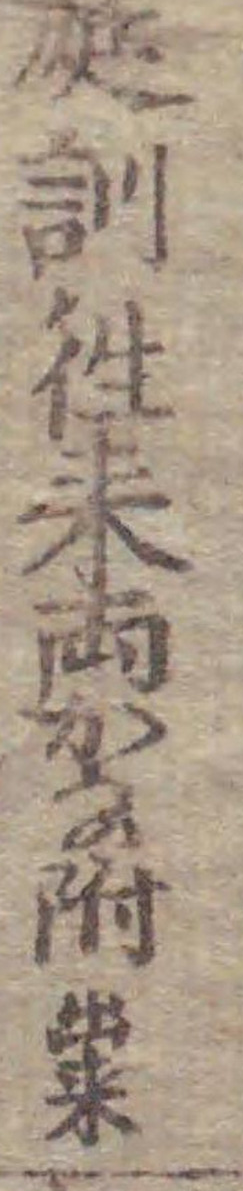庭訓往来両かな附出来
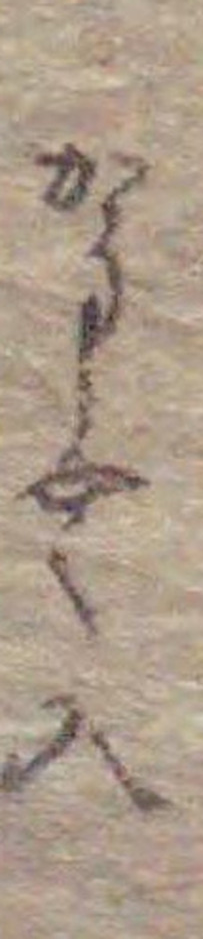かうしやく入
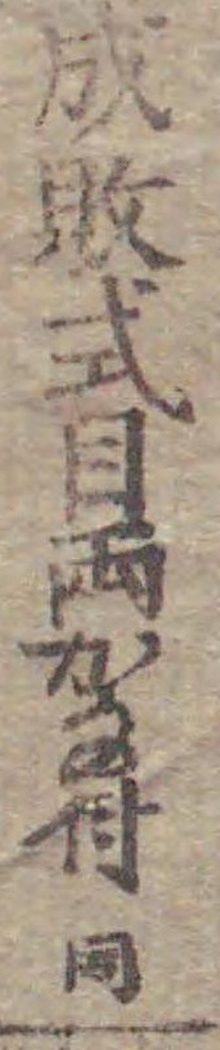御成敗式目両かな付同
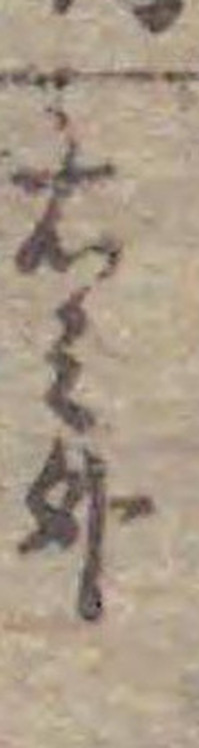右の外
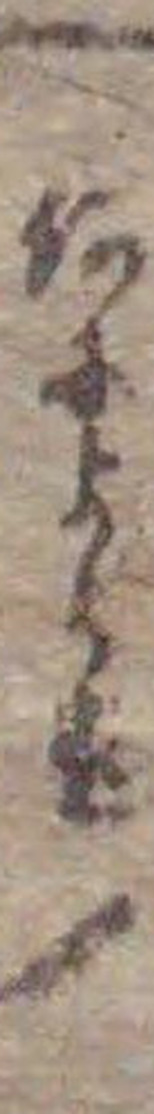何によらす
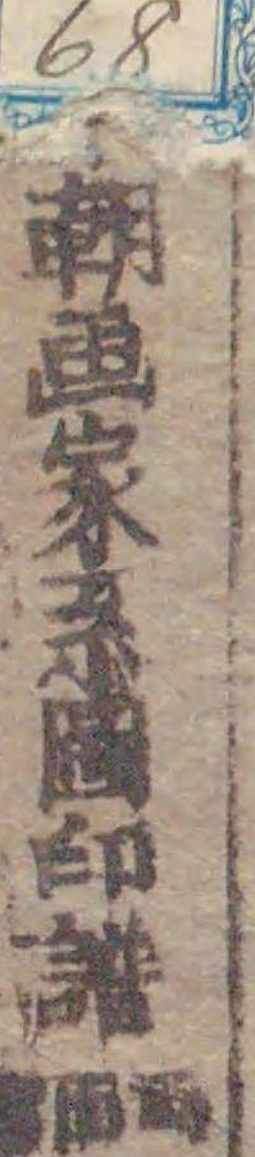朝画家系圖印譜両面摺
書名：[化物一代記] : 5巻
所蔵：国立国会図書館 National Diet Library, JAPAN
